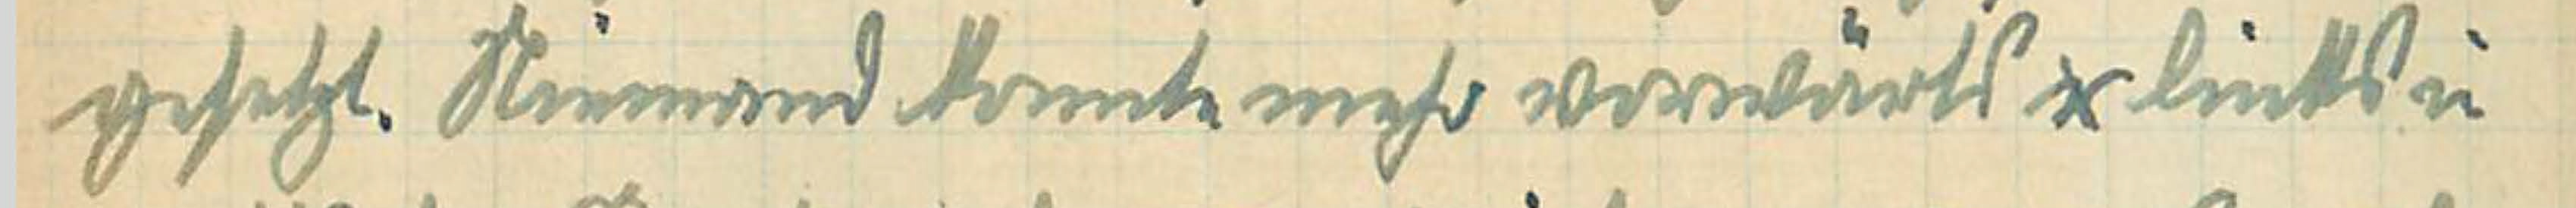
gesetzt. Niemand konnte mehr vorwärts r links u.
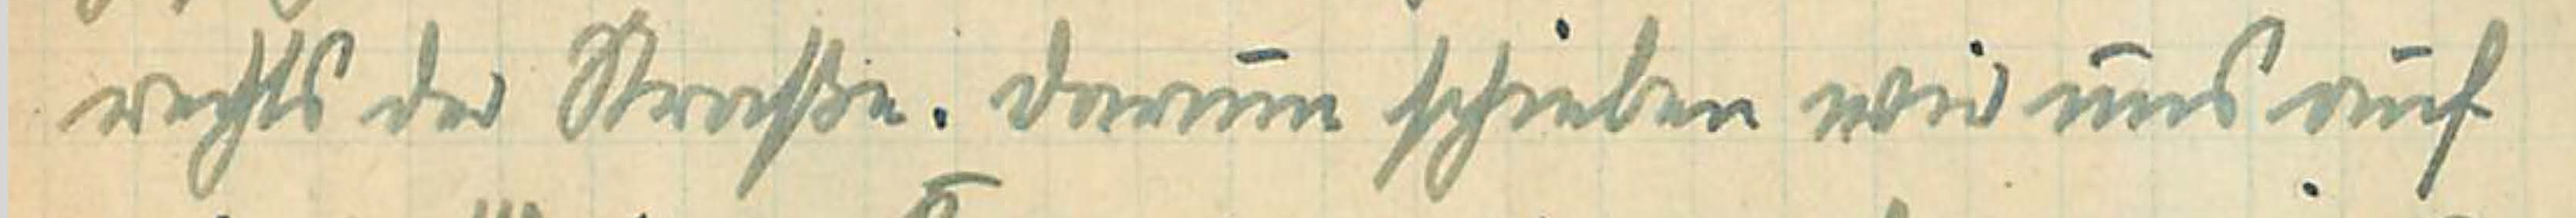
rechts der Straße. Darum schieben wir uns auf
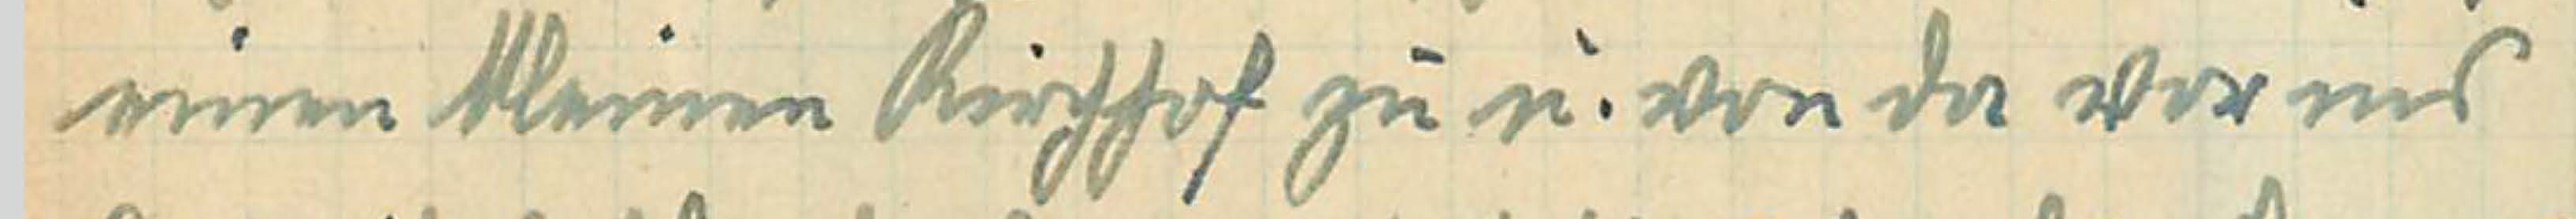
einen kleinen Kirchhof zu u. von da vor ins
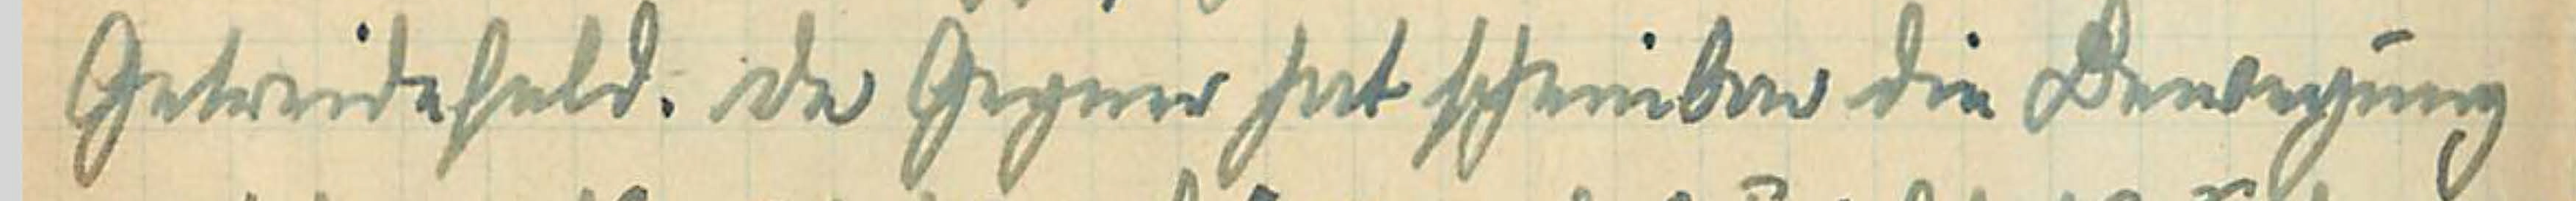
Getreidefeld. Der Gegner hat scheinbar die Bewegung
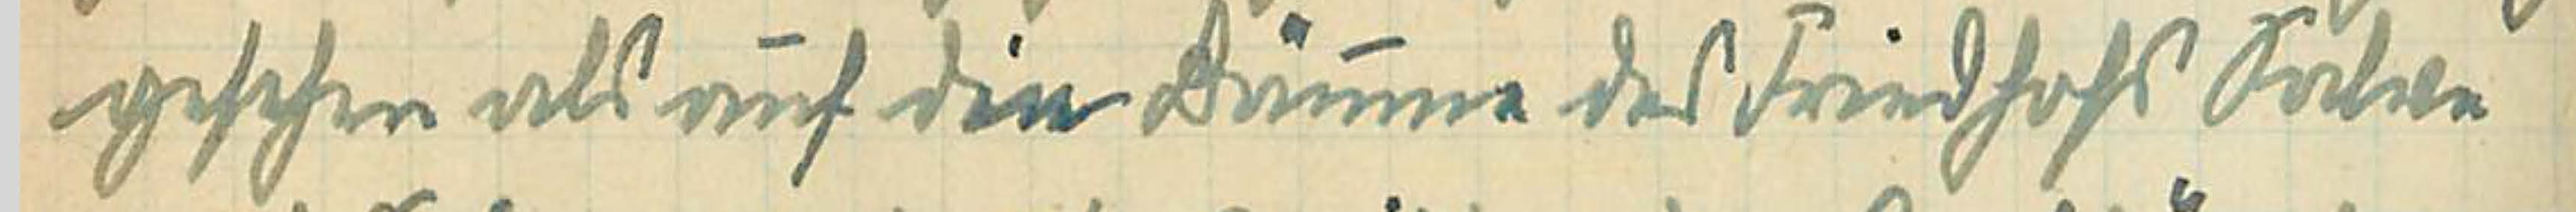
gesehen als auf die Bäume des Friedhofs Salve
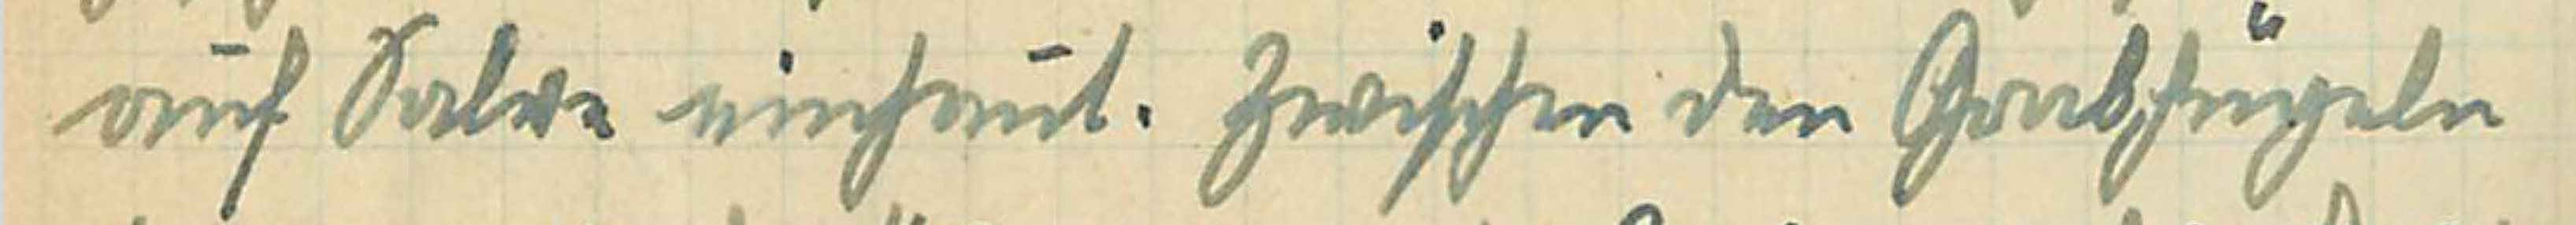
auf Salve einhaut. Zwischen den Grabhügeln
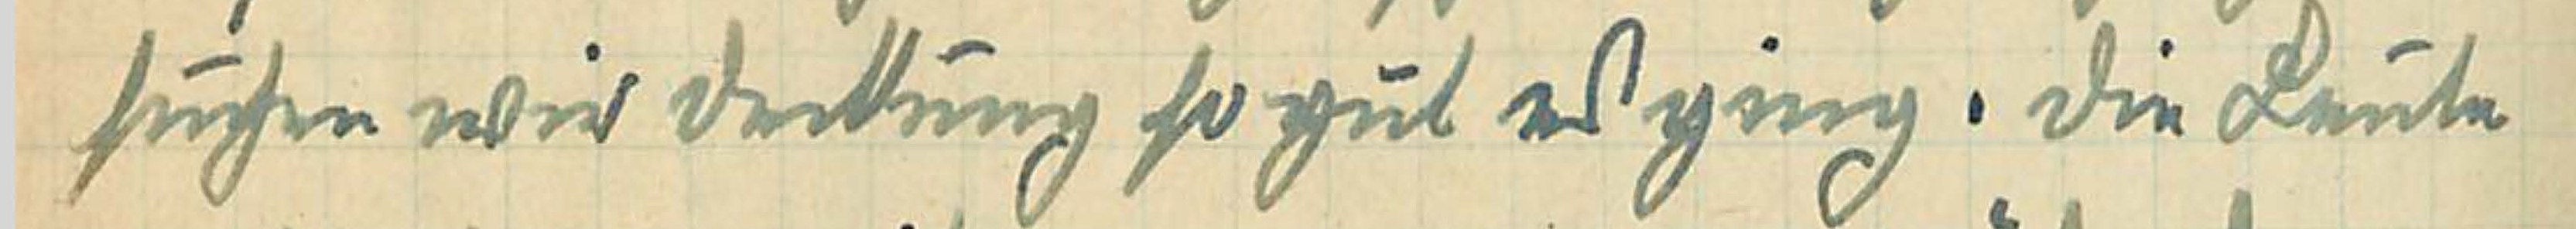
suchen wir Deckung so gut es ging. Die Leute
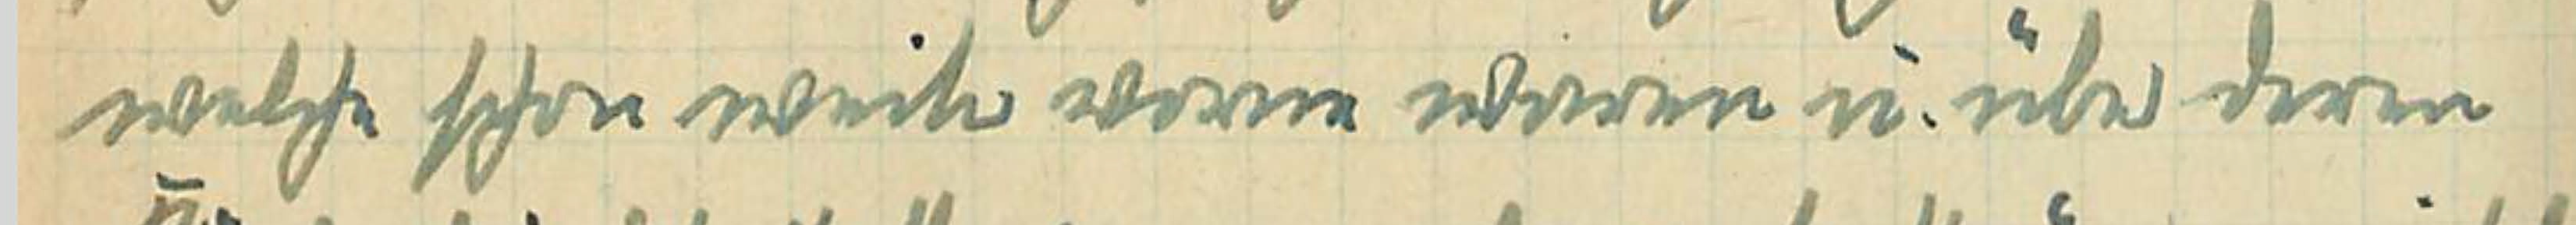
welche schon weiter vorne waren u. über deren
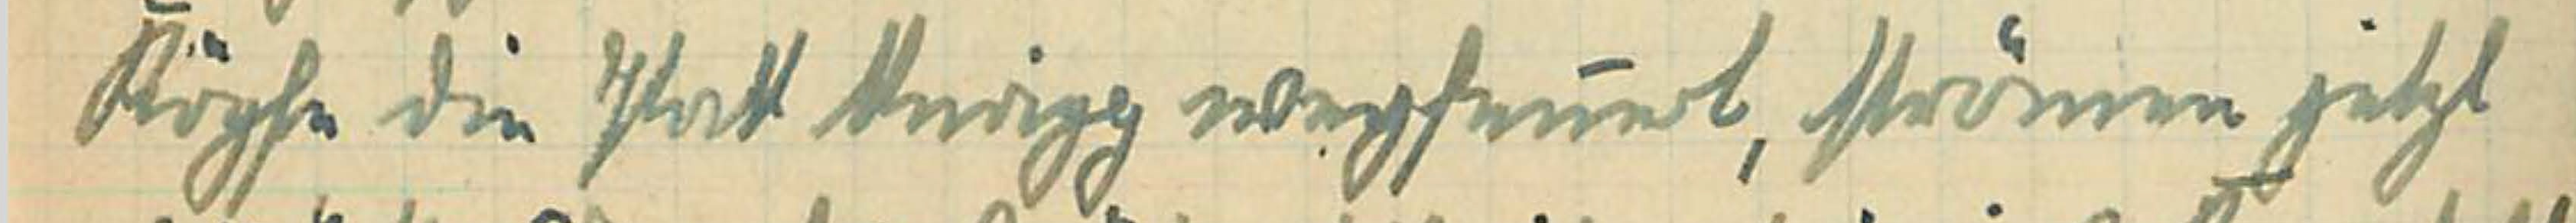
Köpfe die Pak knapp wegfeuert, strömen jetzt
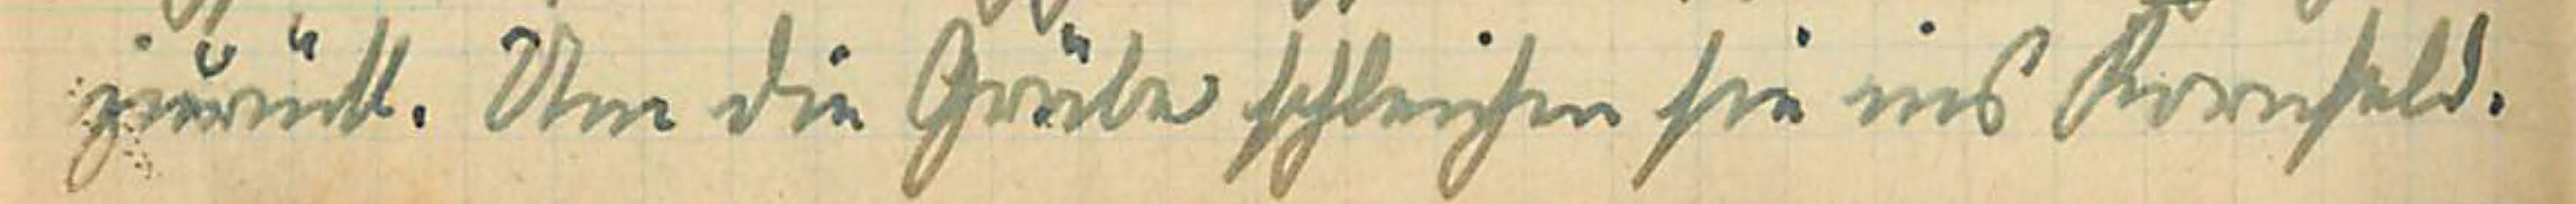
zurück. Um die Gräber schleichen sie ins Kornfeld.
